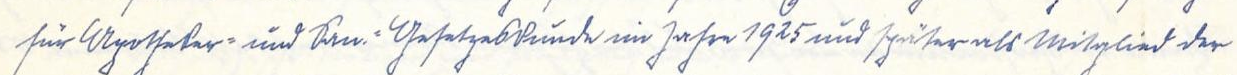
für Apotheker und San.- Gesetzeskunde im Jahre 1925 und später als Mitglied der
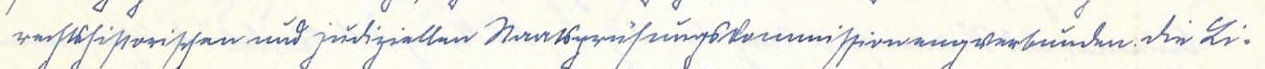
rechtshistorischen und judiziellen Staatsprüfungskommission verbunden. Die Li-
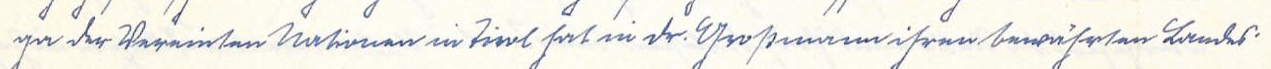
ga der Vereinten Nationen in Tirol hat in Dr. Großmann ihren bewährten Landes-
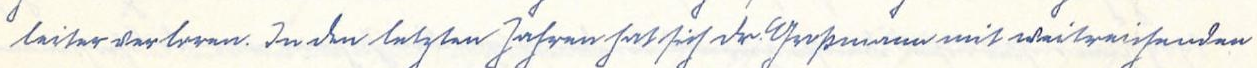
leiter verloren. In den letzten Jahren hat sich Dr. Großmann mit weitreichenden
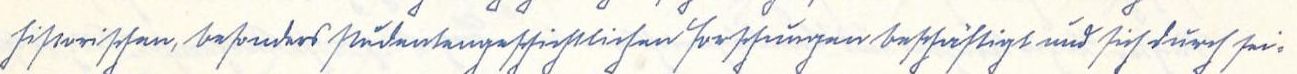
historischen, besonders studentengeschichtlichem Forschungen beschäftigt und sich durch sei-
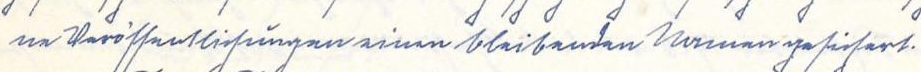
ne Veröffentlichungen einen bleibenden Namen gesichert.
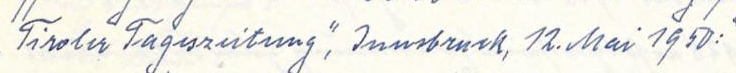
„Tiroler Tageszeitung, Innsbruck, 12. Mai 1950:
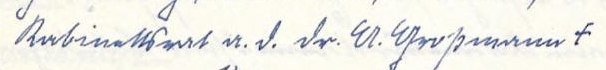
Kabinettsrat a. D. Dr. Alois Großmann +
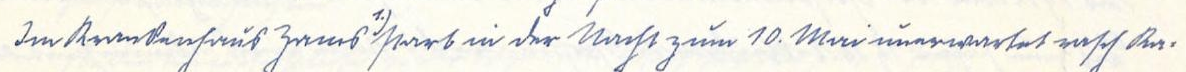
Im Krankenhaus Zams starb in der Nacht zum 10. Mai unerwartet rasch
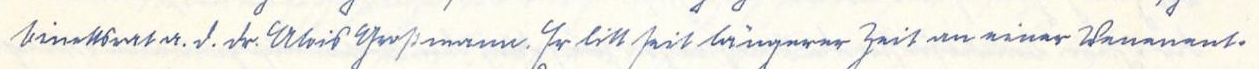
Kabinettsrat a. D. Dr. Alois Großmann. Er litt seit längerer Zeit an einer Venenent-
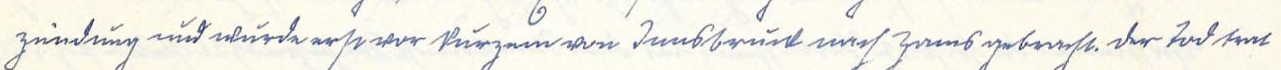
zündung und wurde erst vor Kurzem von Innsbruck nach Zams gebracht. Der Tod trat
